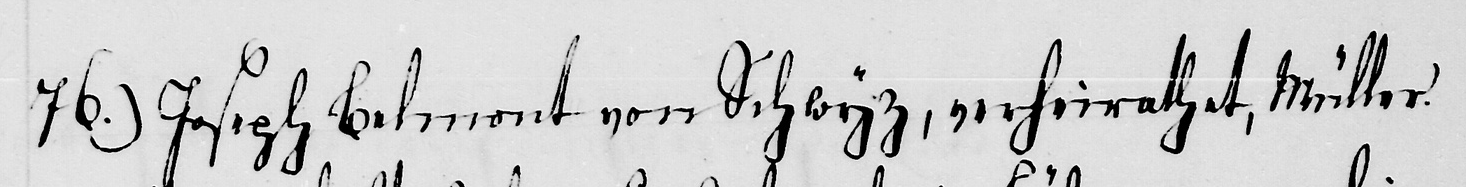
76.) Joseph Belmont von Schwyz, verheirathet, Müller.
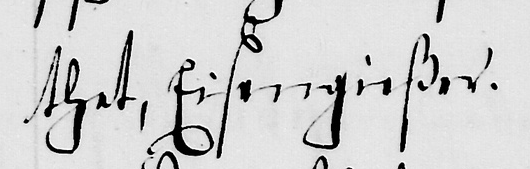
thet, Eisengießer.
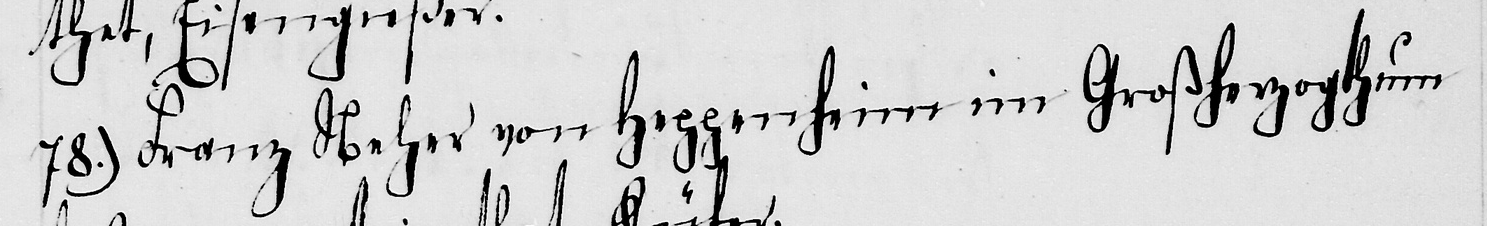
78.) Franz Neher von Heppenheim im Großherzogthum
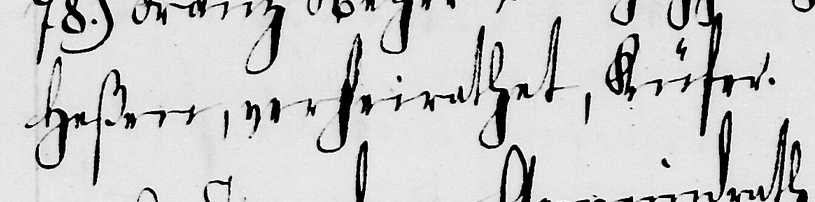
Heßen, verheirathet, Küfer.
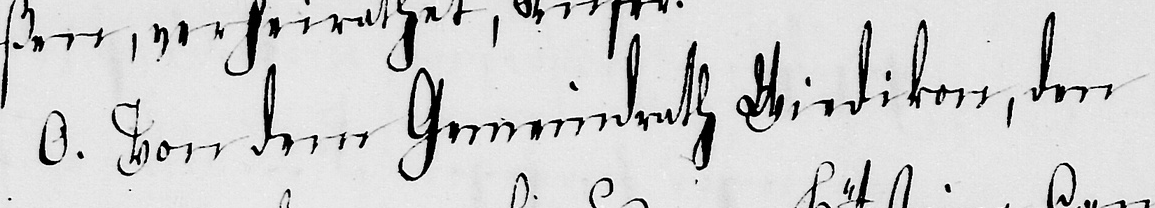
O. Von dem Gemeindrath Wiedikon, den
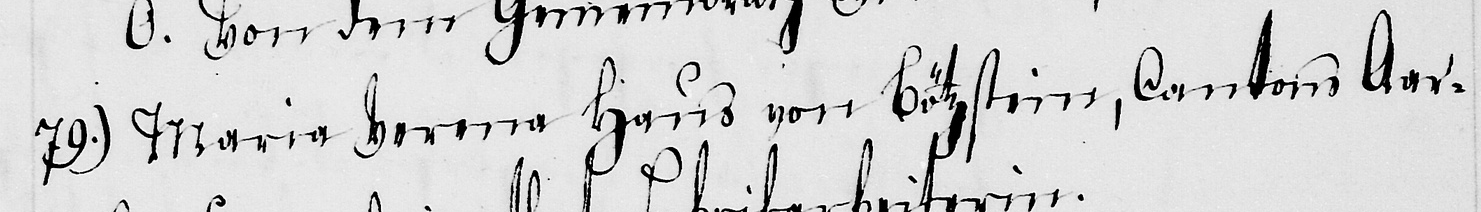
79.) Maria Verena Haus von Bötzstein, Cantons Aar¬
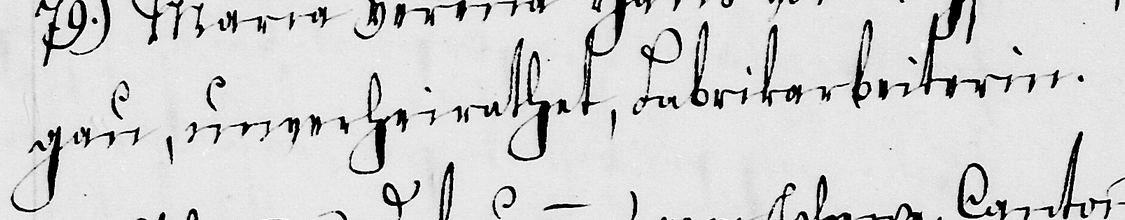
gau, unverheirathet, Fabrikarbeiterin.
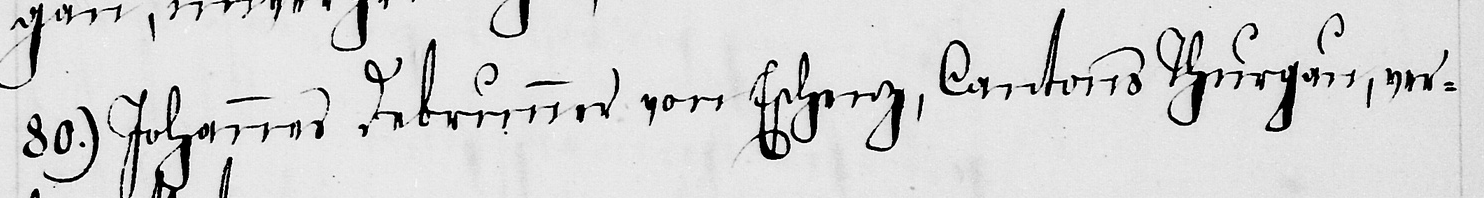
80.) Johannes Debrunner von Eschenz, Cantons Thurgau, ver¬
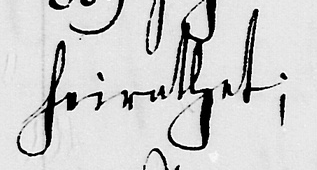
heirathet;
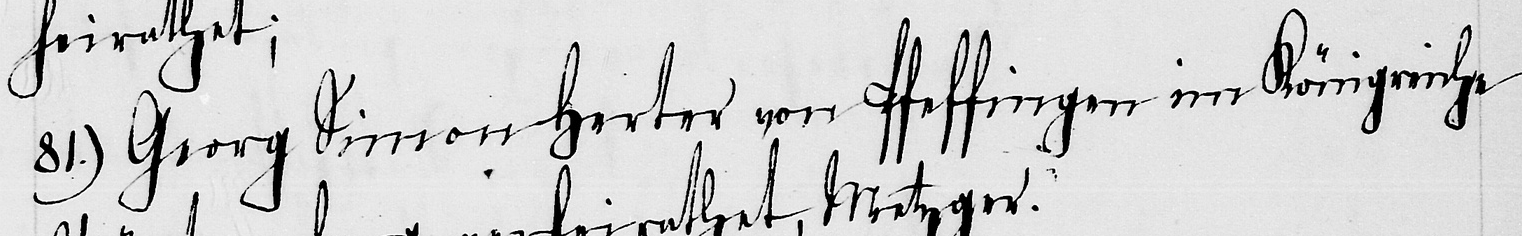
81.) Georg Simon Herter von Pfeffingen im Königreiche
